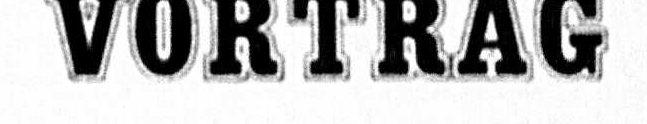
VORTRAG
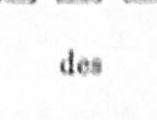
des
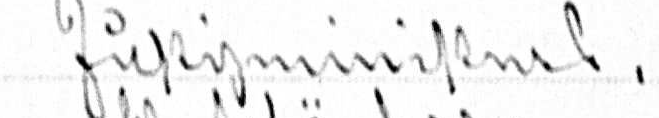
Justizministers
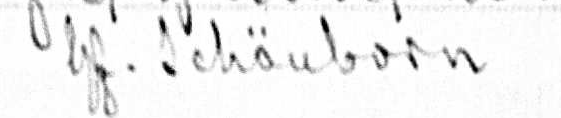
Gf Schönborn
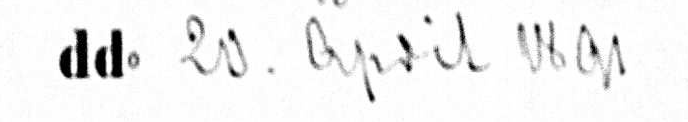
Ddo 20. April 1891
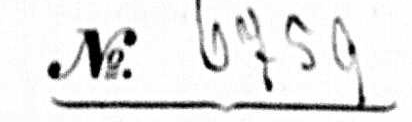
No. 6759
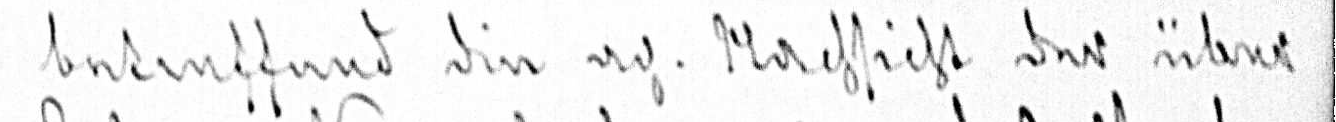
betreffend die ag. Nachsicht über
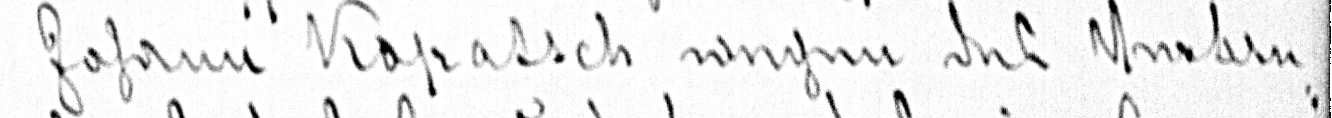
Johann Kopatsch wegen des Verbre¬
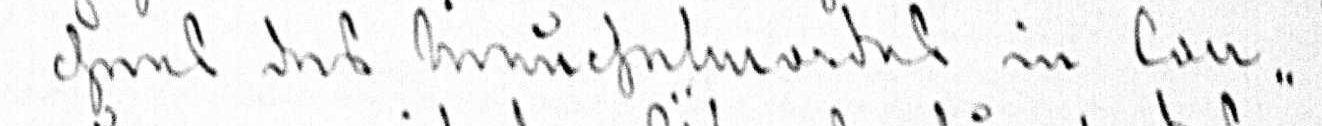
chens des Meuchelmordes in Con¬
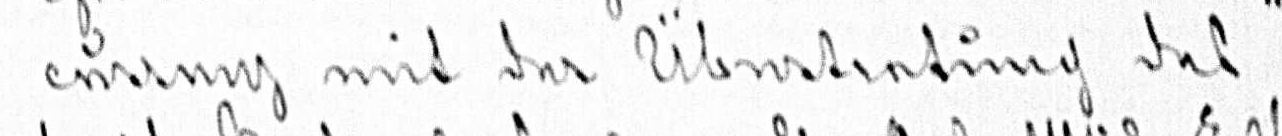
currenz mit der Übertretung des
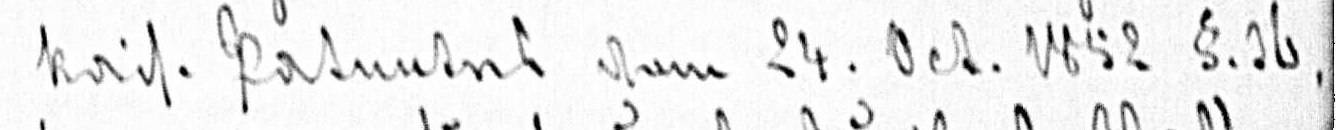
kais. Patentes vom 24. Oct. 1852 §26,
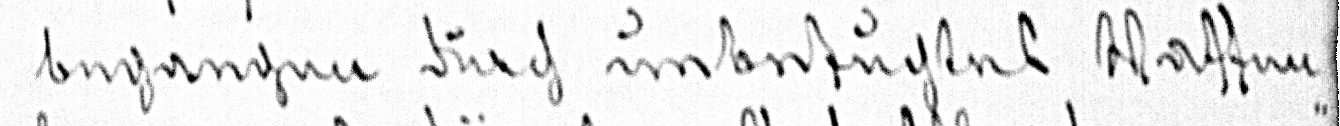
begangene durch unbefugtes Waffen¬
